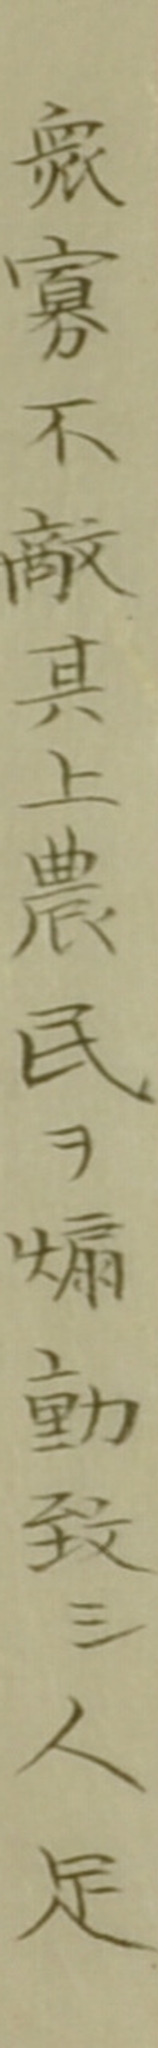衆寡不敵其上農民ヲ煽致シ人足
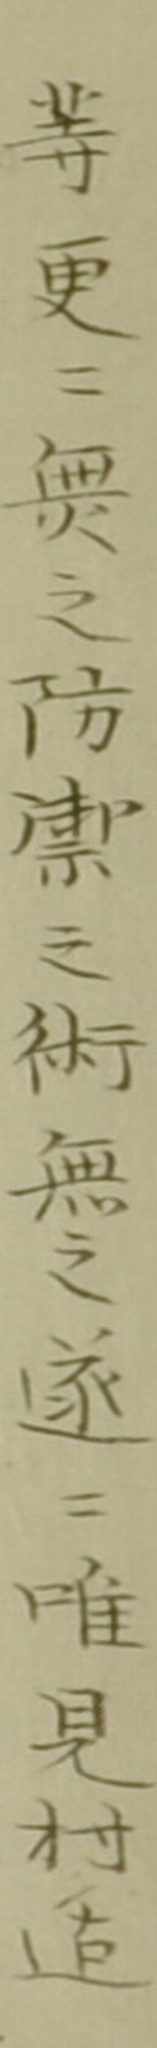等更ニ奥之防禦之術無之遂ニ唯見村迄
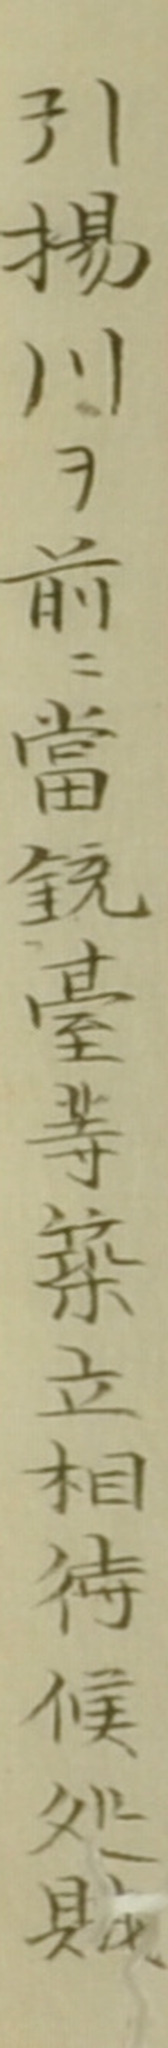引揚川ヲ前ニ当銃代台等築立相待候処賊

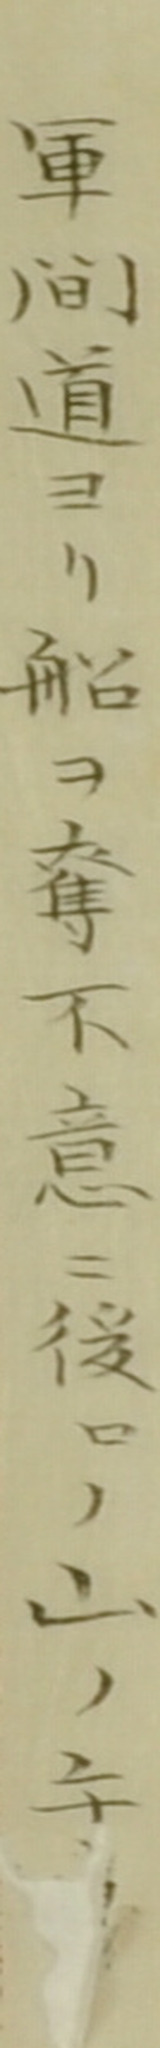軍間道ヨリ船ヲ奪不意ニ後ロノ山ノ手
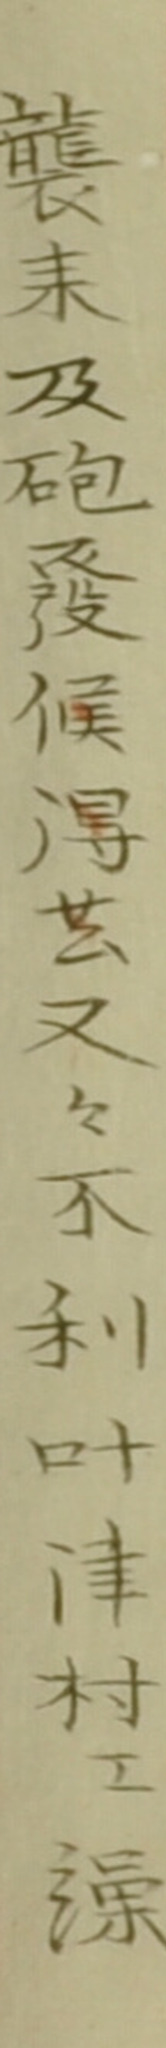襲来及砲発候得共又々不利叶津村エ繰
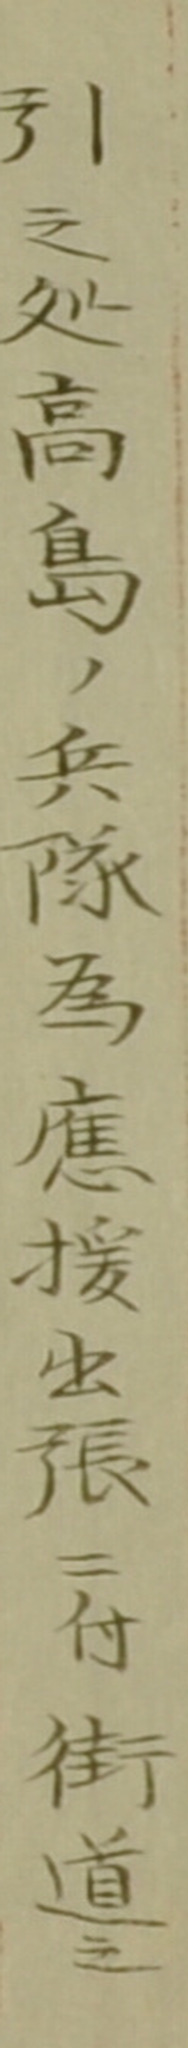引之処高島ノ兵隊為応援出張ニ付街道之
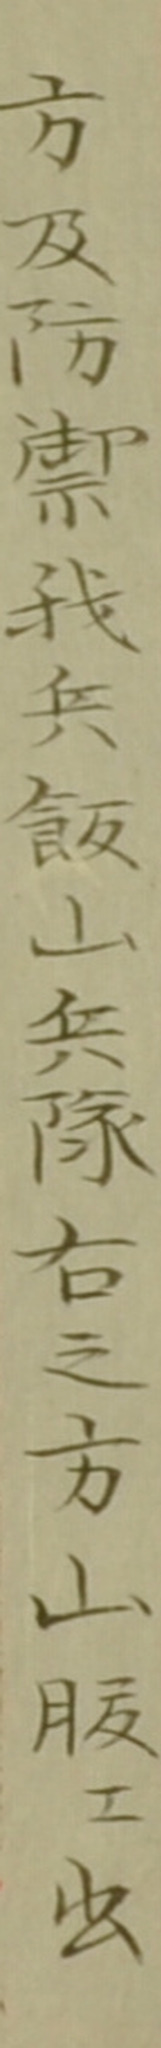方及防禦我兵飯山兵隊右之方山腹エ出
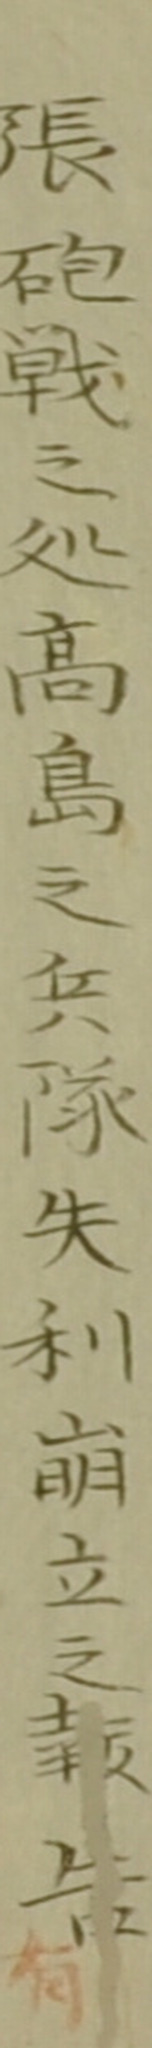張砲戦之処高島之兵隊失利崩立之趣旨
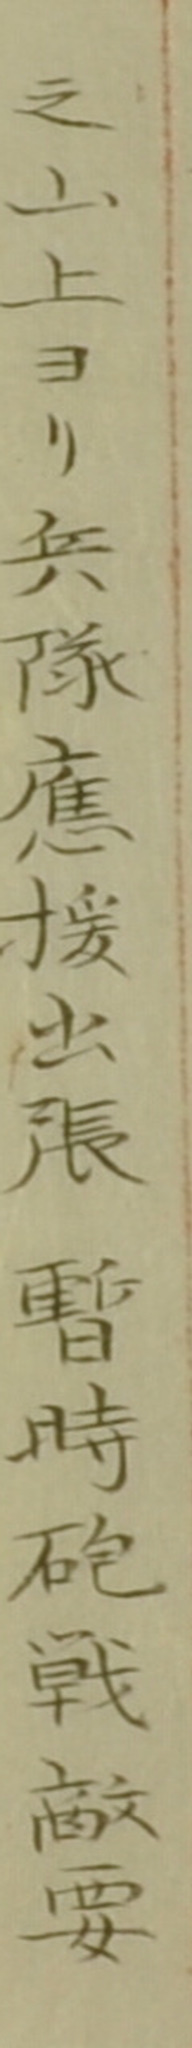之山上ヨリ兵隊応援出張暫時砲戦敵要
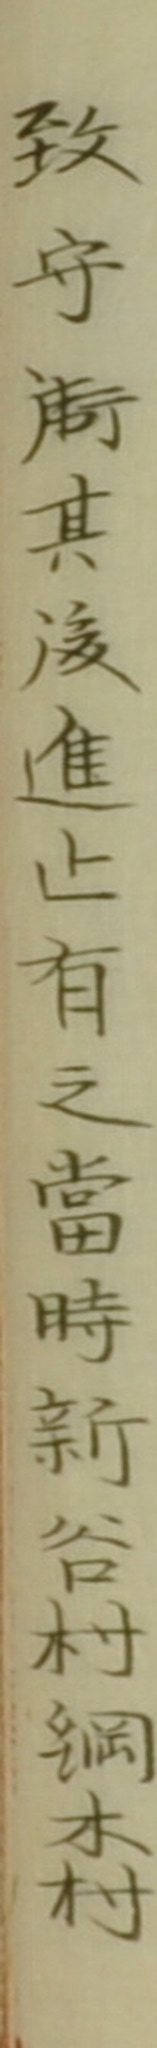致守衛其後進止有之当時新谷村綱木村
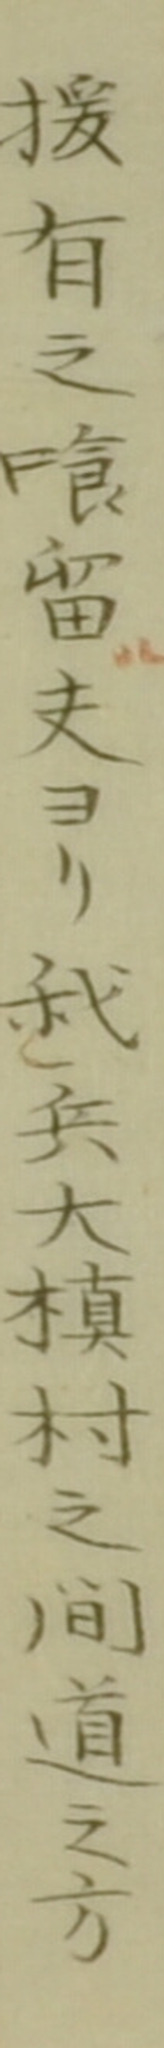援有之喰留夫ヨリ我兵大槙村之間道之方
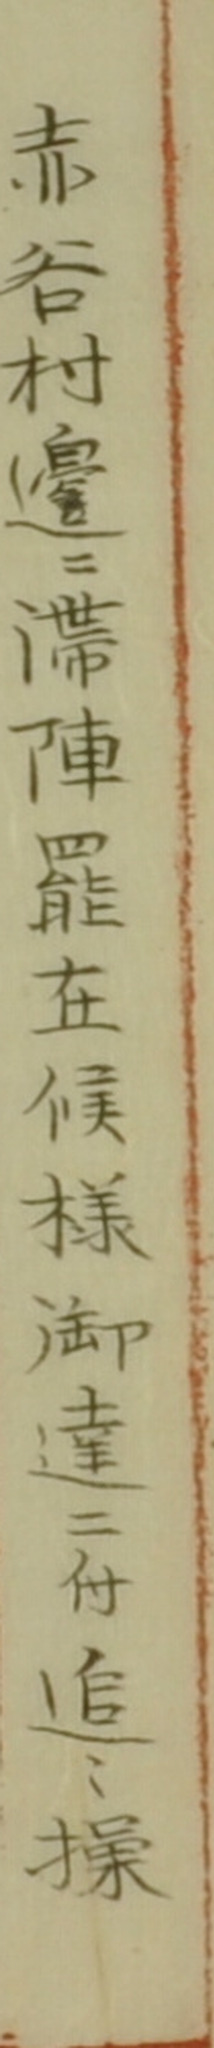赤谷村辺ニ滞陣罷在候御達ニ付追々操
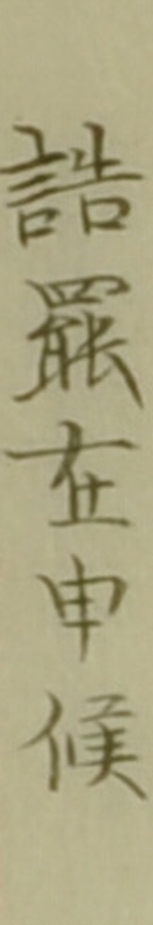詰罷在申候
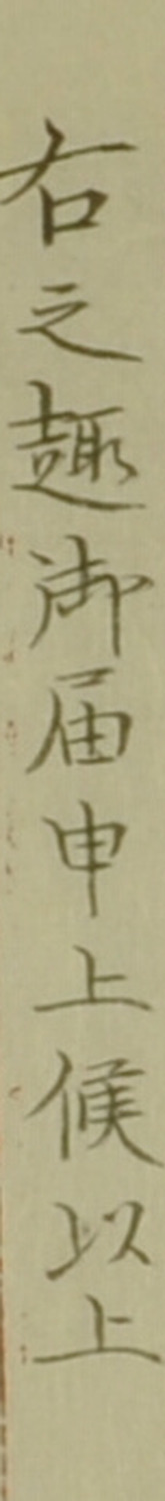右之趣御届申上候以上
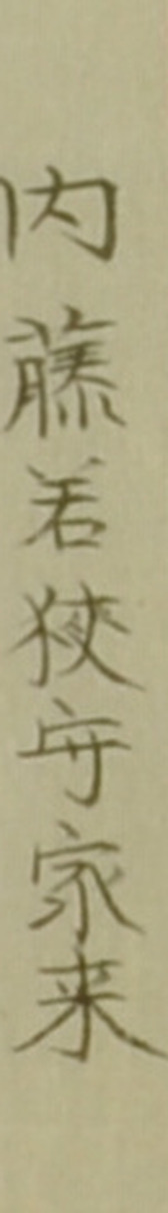内藤若狭守家来
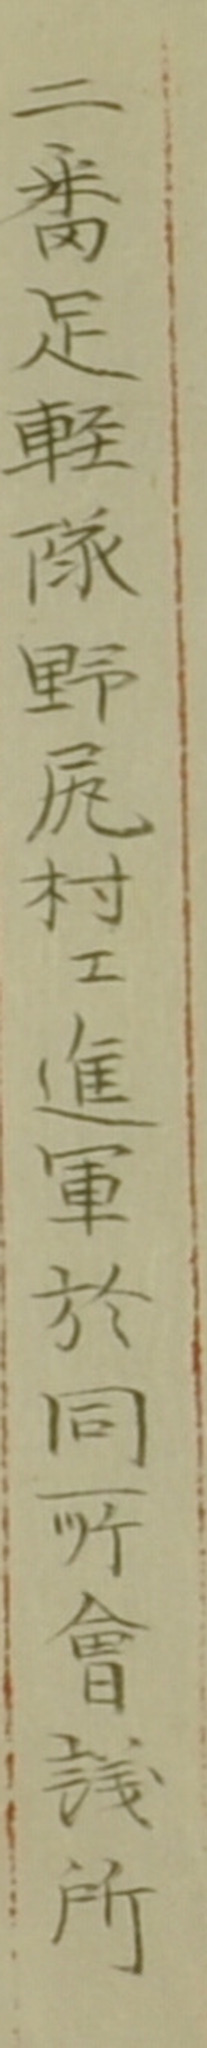二番足軽隊野尻村ニ進軍於同所会議所
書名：奥越出兵中戦争之事件概略抄録（控）
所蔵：伊那市立高遠町図書館・合同会社AMANE
